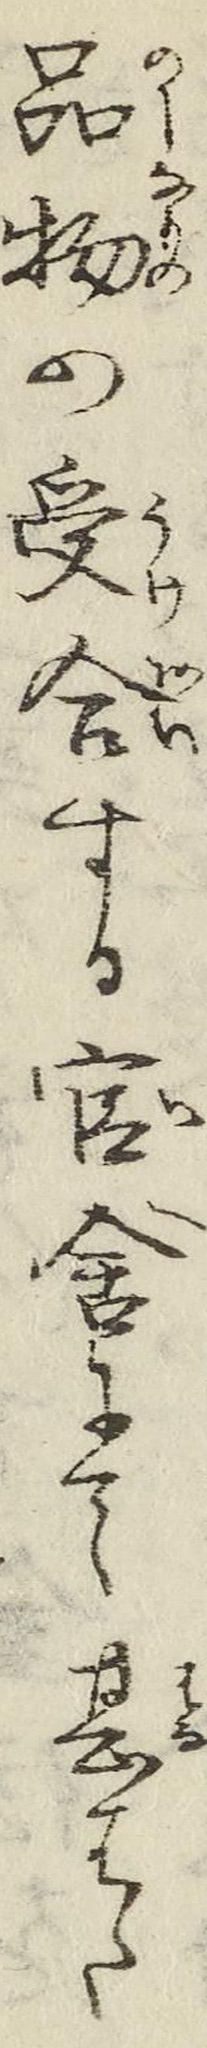品物の受合する官舎にて甚はた
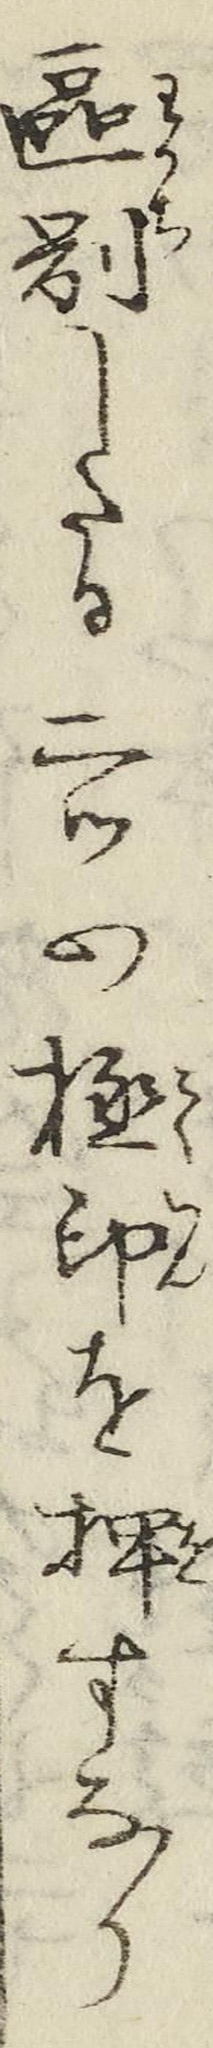区別したる二つのの極印を押すなり
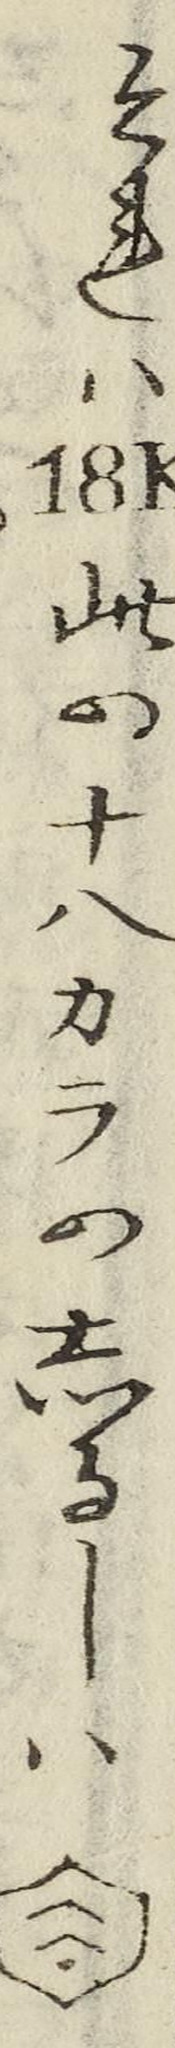それは１８Ｋ此の十八カラのしるしは
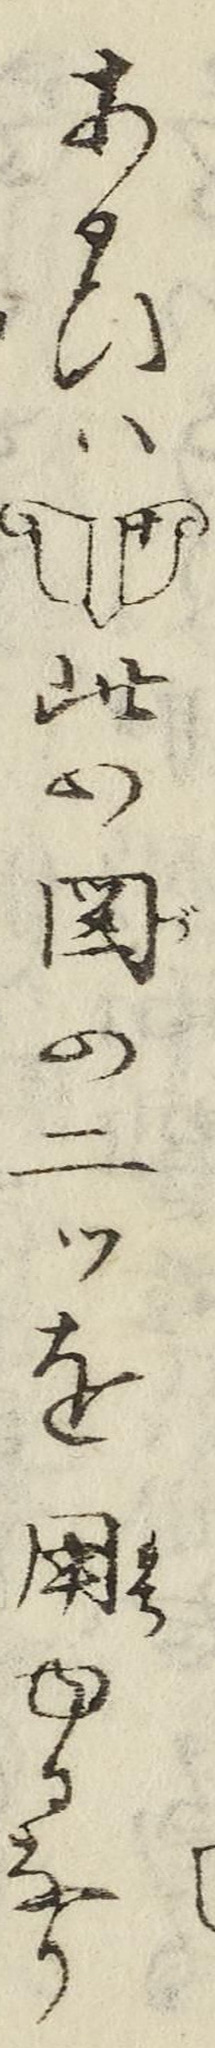あるひは此の図の二つを用ゆるなり
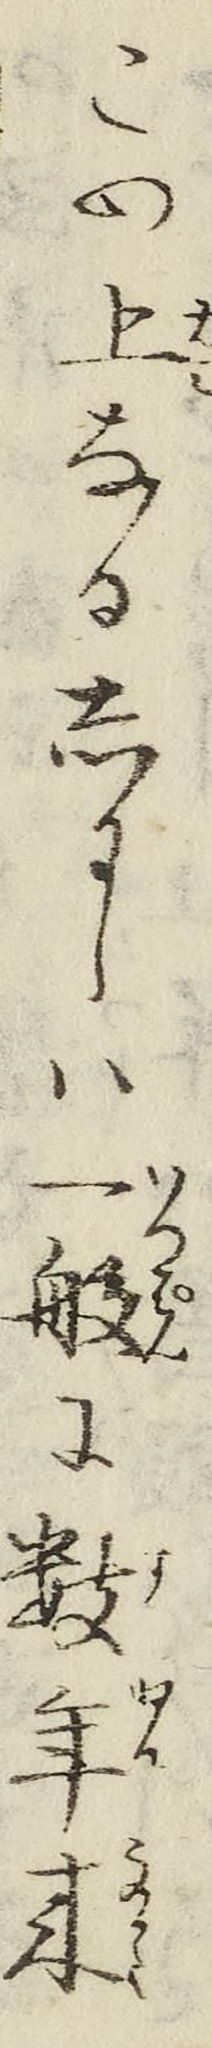この上なるしるしは一般に数年来
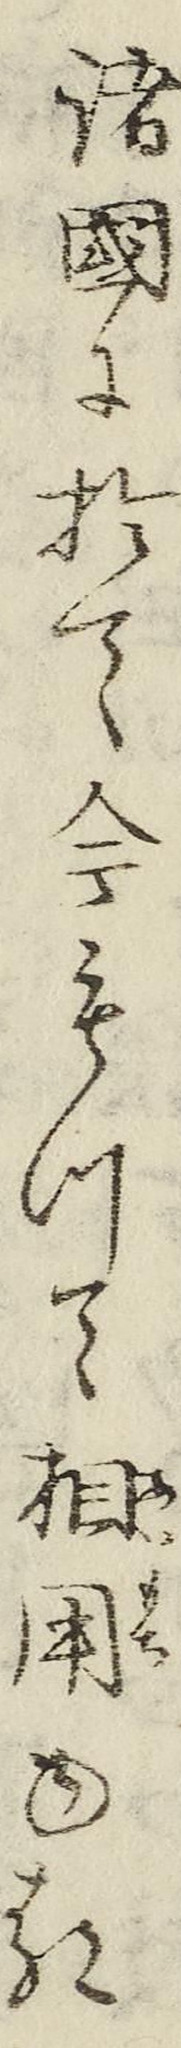諸国に於て今もつて相用ゆる
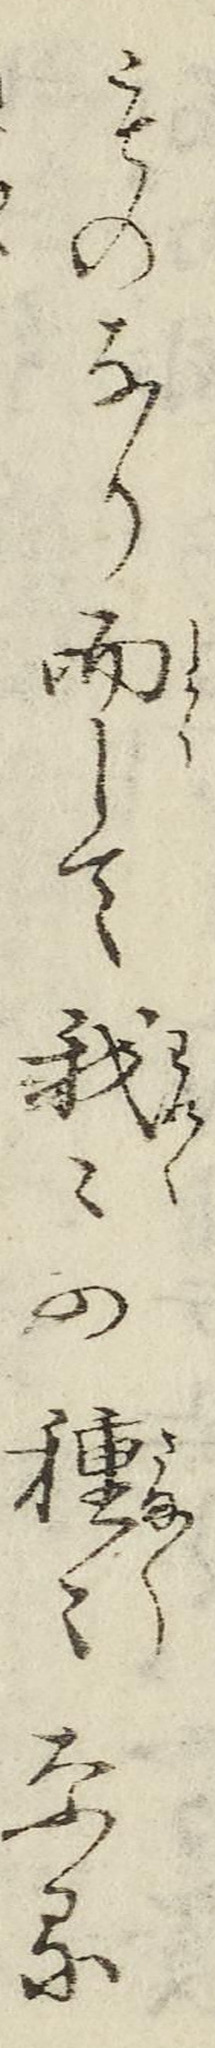ものなり而して我〻の種〻なる
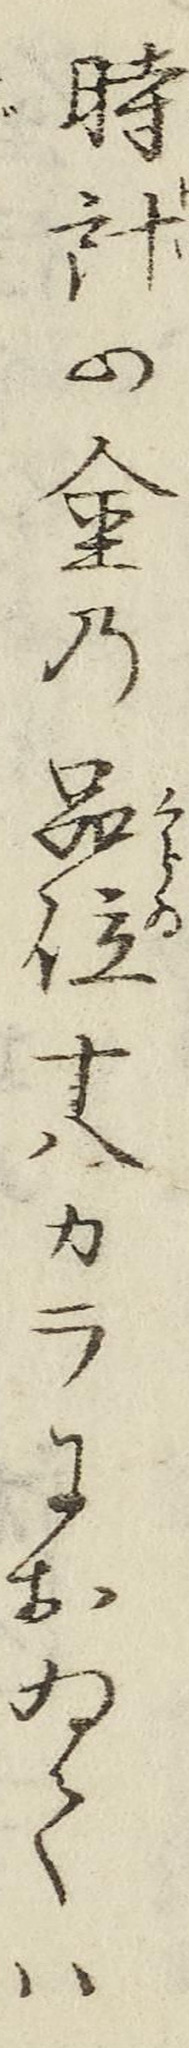時計の金の品位十八カラにおゐては
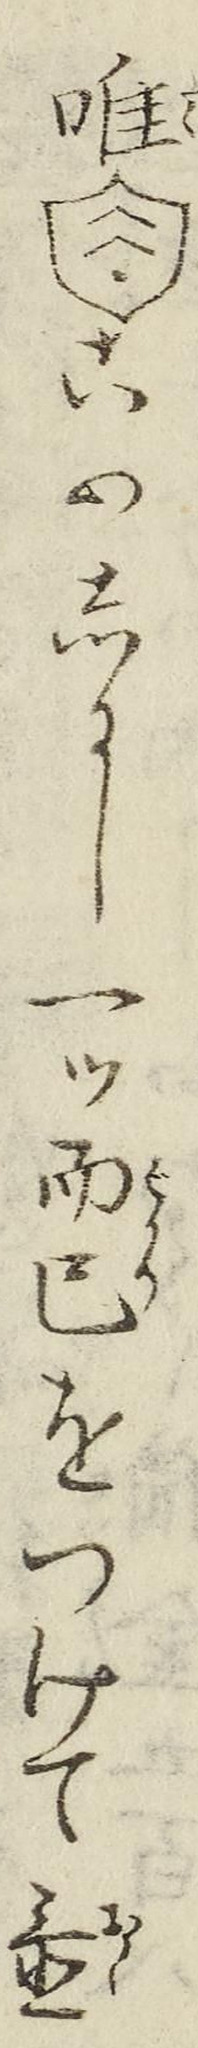唯このしるし一つ而已をつけて置
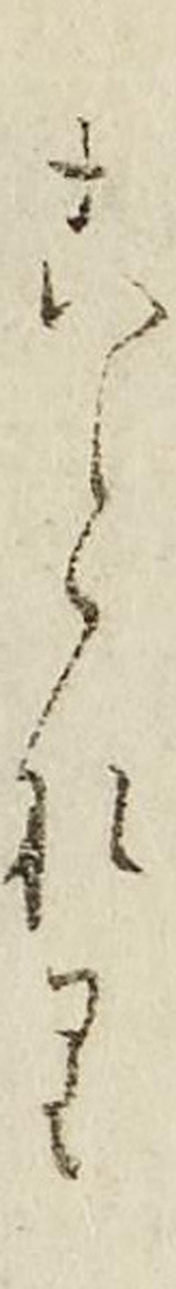ことなり
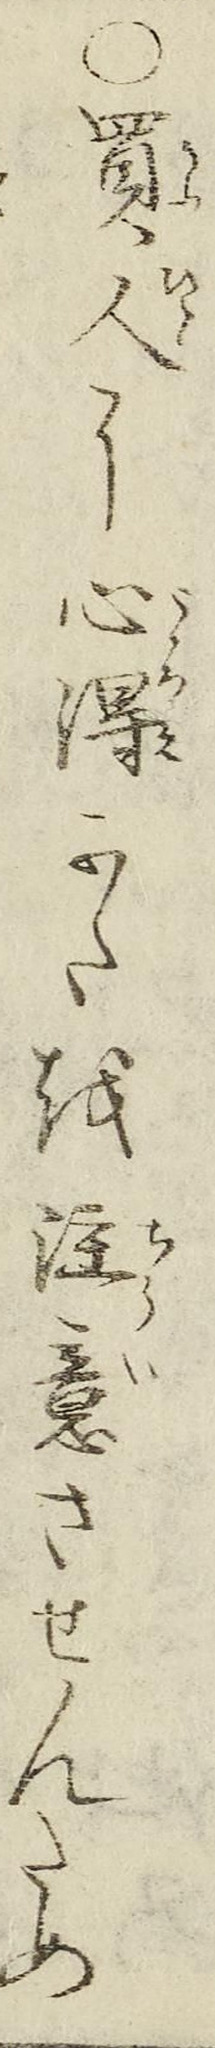○買人に心得かたを注意させんため
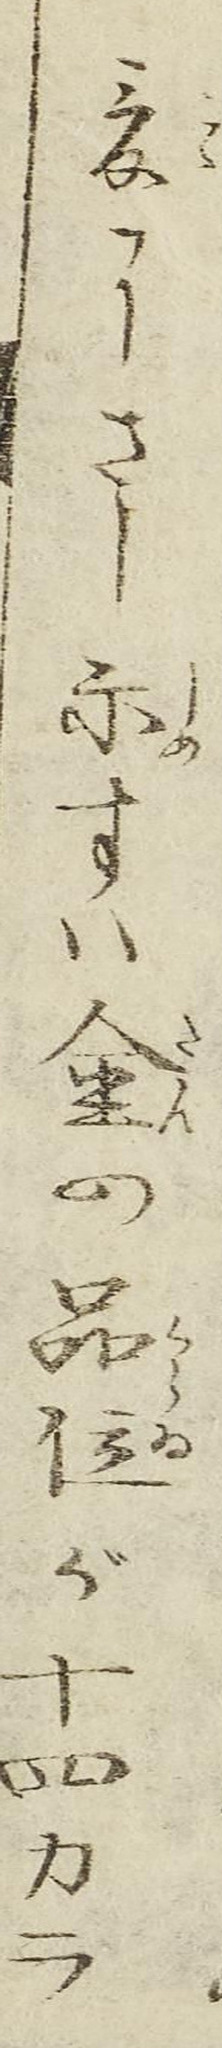爰にさし示すは金の品位が十四カラ

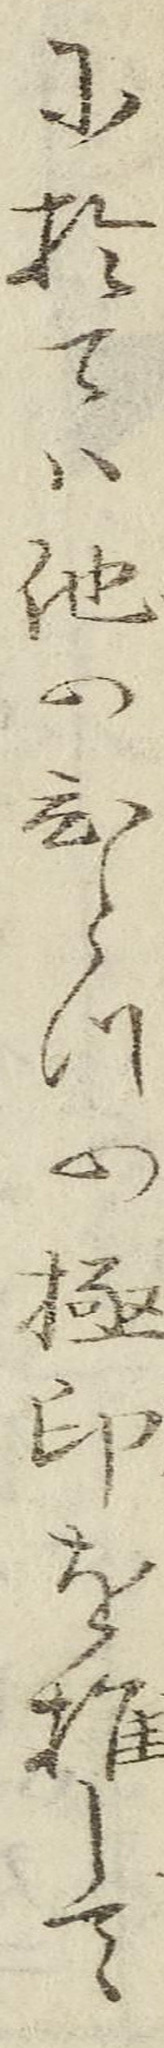に於ては他のひとつの極印を推して
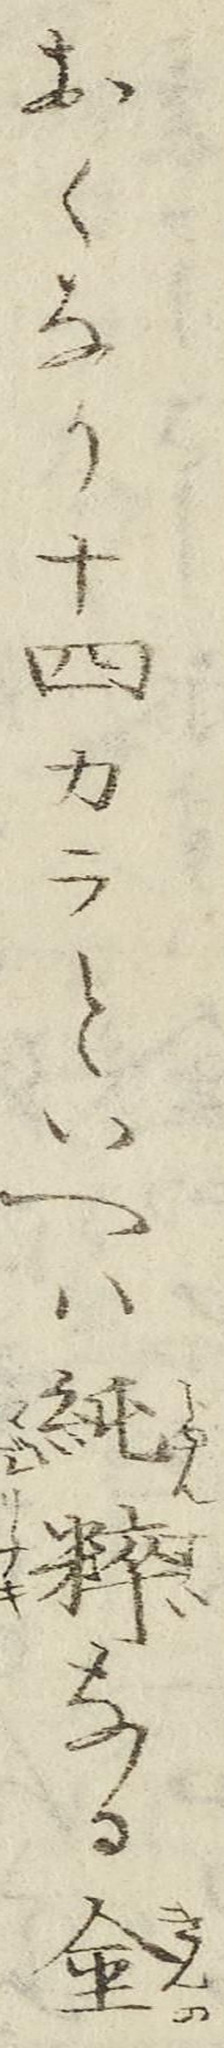おくなり十四カラといへは純粋なる金
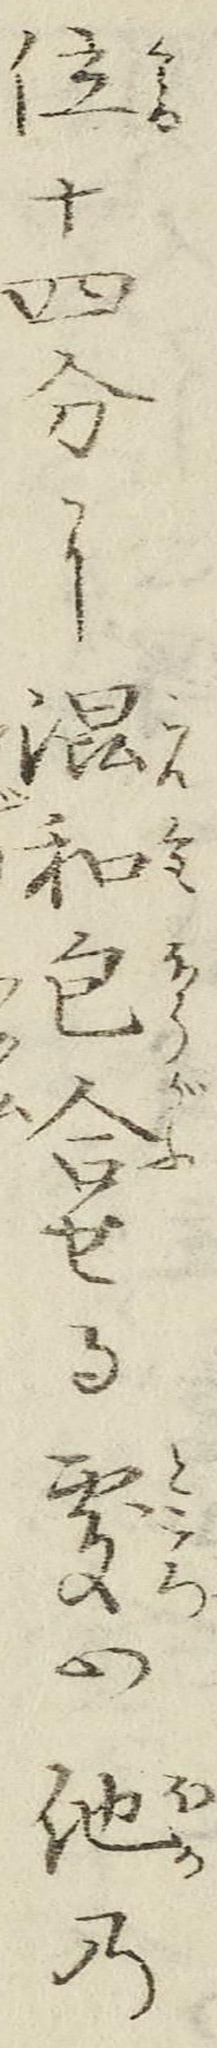位十四分に混和包合せる処の他の
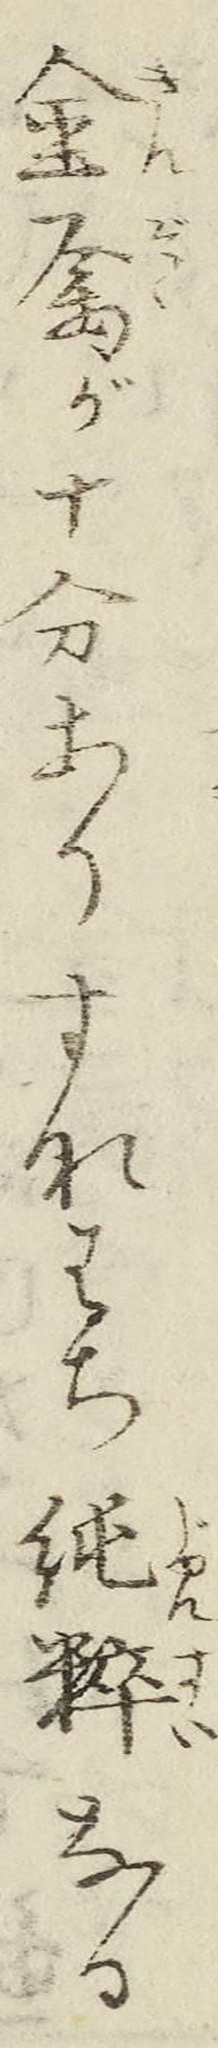金属が十分ありすなはち純粋なる
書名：[時計に関する冊子]
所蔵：東京大学地震研究所図書室 Earthquake Research Institute Library, The University of Tokyo, JAPAN
